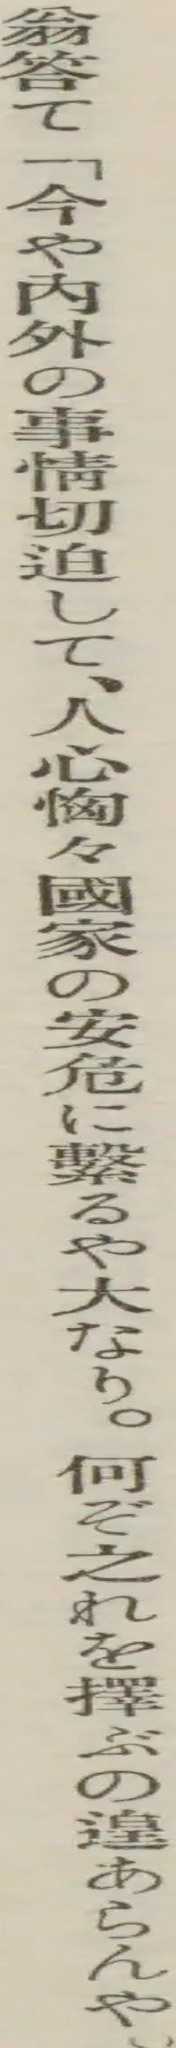翁答て「今や内外の事情切迫して、人心恟々国家の安危に繋るや大なり。何ぞ之れを択ぶの遑あらんや。
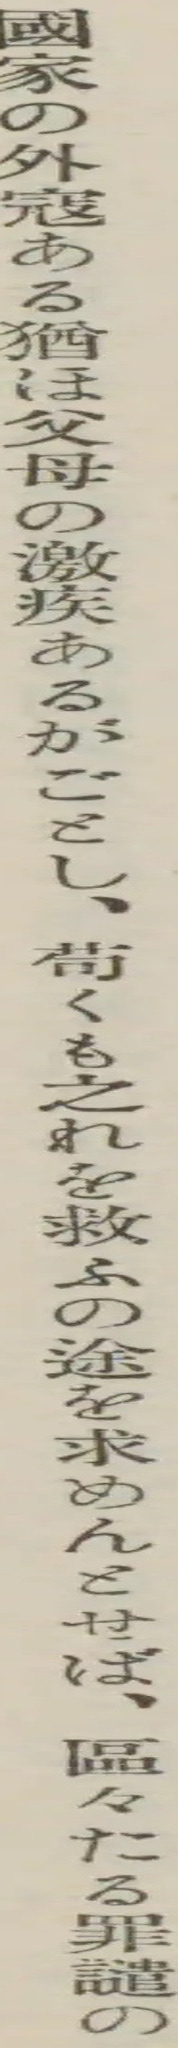国家の外寇ある猶ほ父母の激疾あるがごとし、苟くも之れを救ふの途を求めんとせば、区々たる罪譴の
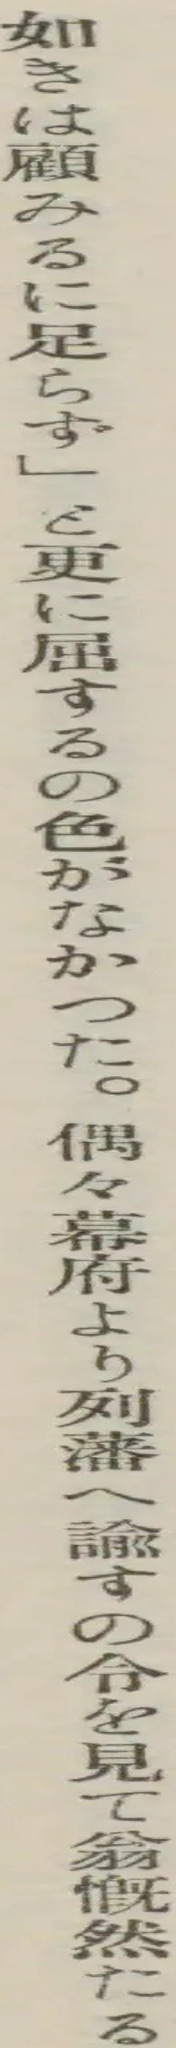如きは顧みるにたらず」と更に屈するの色がなかつた。偶々幕府より列藩へ諭すの令を見て翁慨然たる
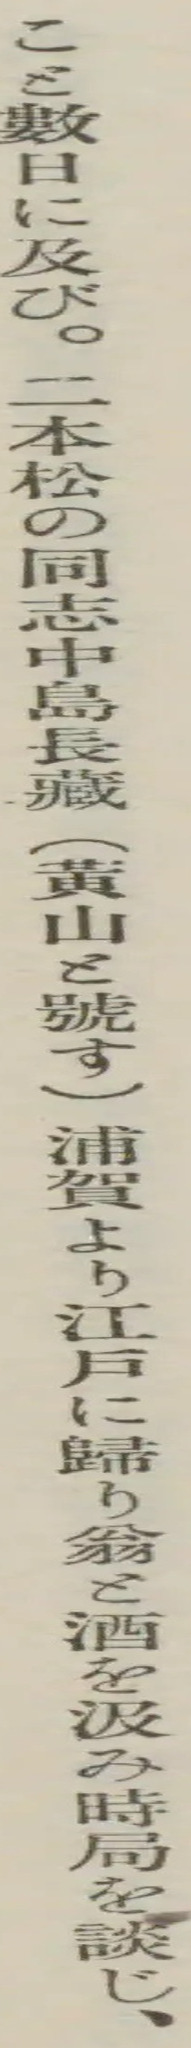こと数日に及び。二本松の同志中島長蔵(黄山と号す)浦賀より江戸に帰り翁と酒を汲み時局を談じ、
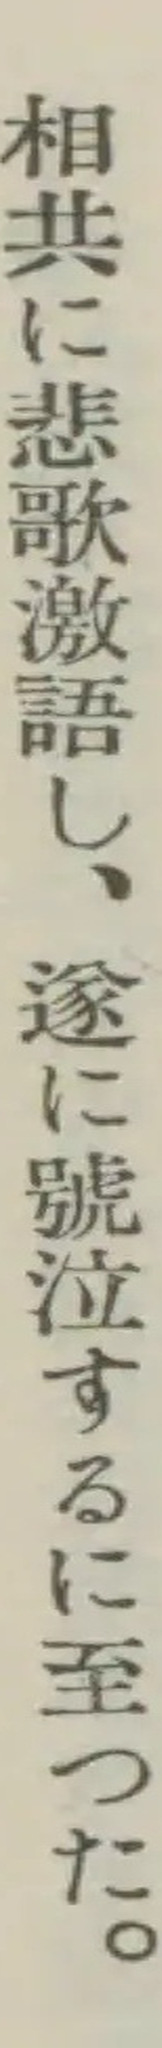相共に悲歌激語し、遂に号泣するに至つた。
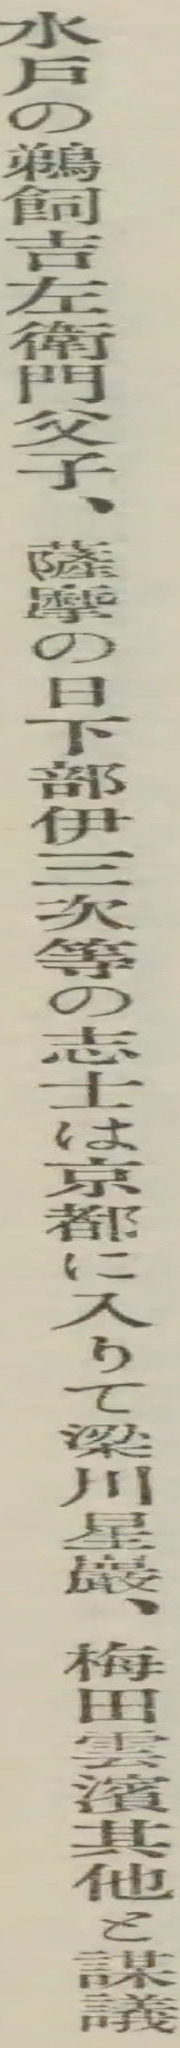水戸の鵜飼吉左衛門父子、薩摩の日下部伊三次等の志士は京都に入りて梁川星巌、梅田雲濱其他と謀議
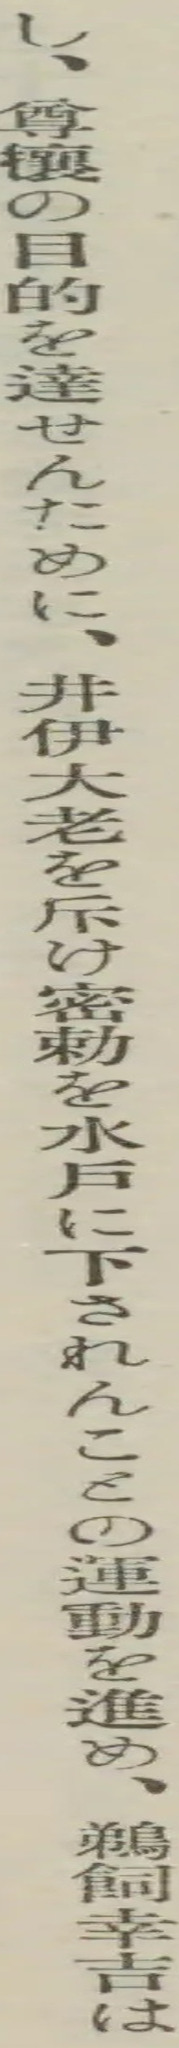し、尊攘の目的を達せんために、井伊大老を斥け密勅を水戸に下されんことの運動を進め、鵜飼幸吉は
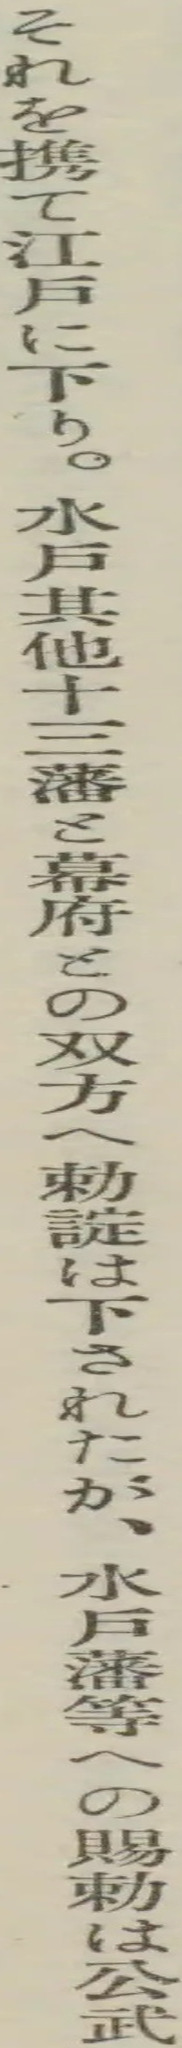それを携て江戸に下り。水戸其他十三藩と幕府との双方へ勅諚は下されたが、水戸藩等への賜勅は公武
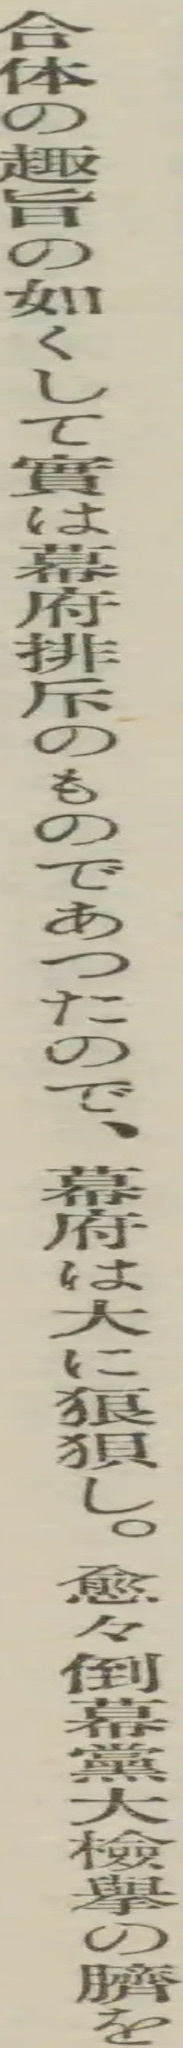合体の趣旨の如くして実は幕府排斥のものであつたので、莫部は大に狼狽し。愈々倒幕党検挙の臍を
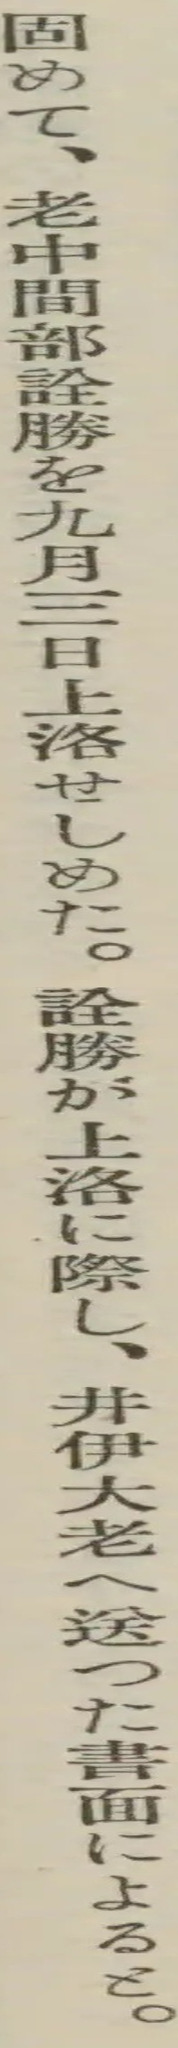固めて、老中間部詮勝を九月三日上洛せしめた。詮勝が上洛に際し、井伊大老へ送つた書面によると。
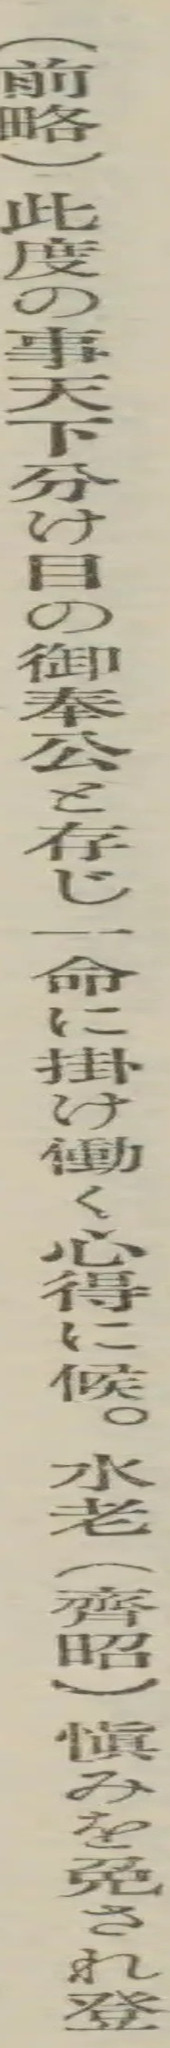(前略)此度の事天下分け目の御奉公と存じ一命に掛け働く心得に候。水老慎みを免され登
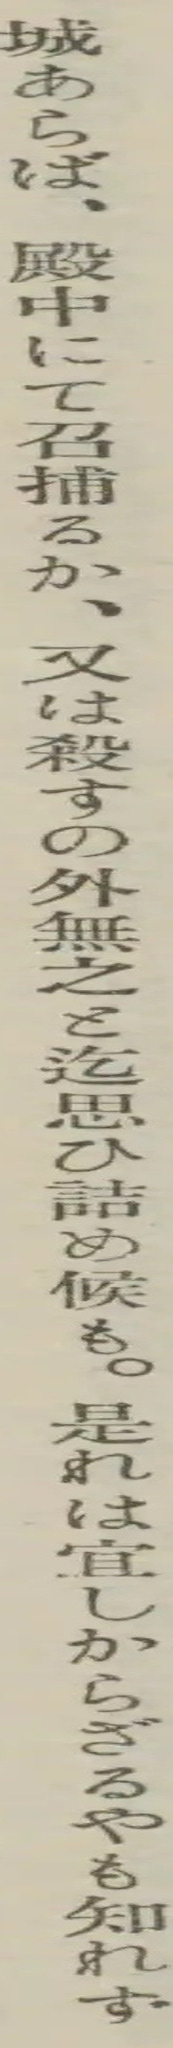城あらば、殿中にて召捕るか、又は殺すの外無之と迄思ひ詰め候も。是れは宜しからざるやも知れず
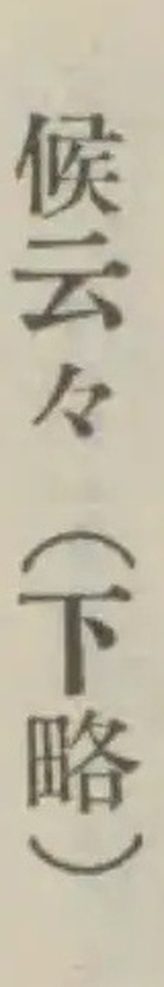候云々(下略)
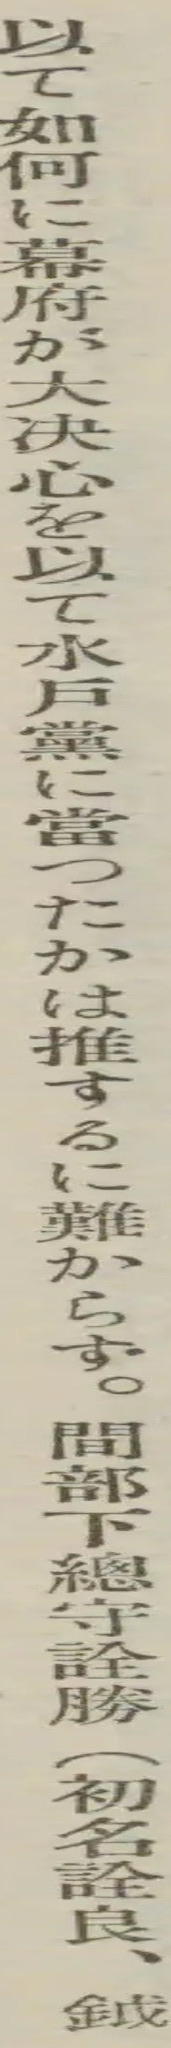以て如何に幕府が大決心を以て水戸党に当つたかは推するに難からず。間部下総守詮勝(初名詮良、龯
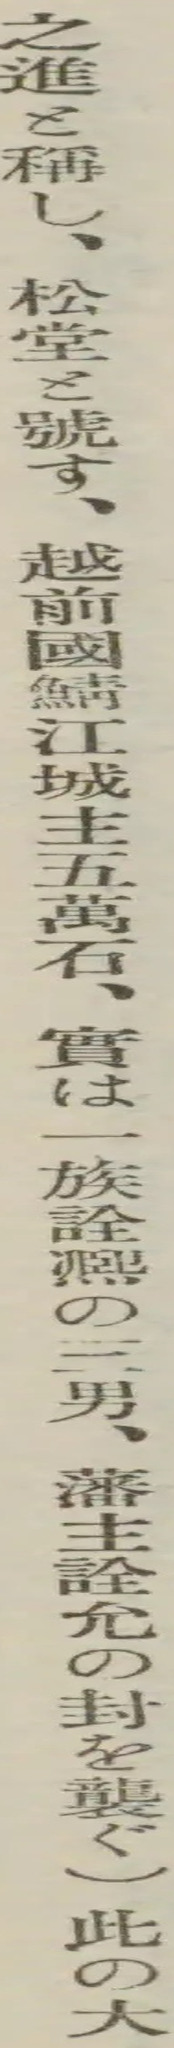之進と称し、松堂と号す、越前国鯖江城主五万石、実は一族詮凞の三男、藩主詮允の封を襲ぐ)此の大
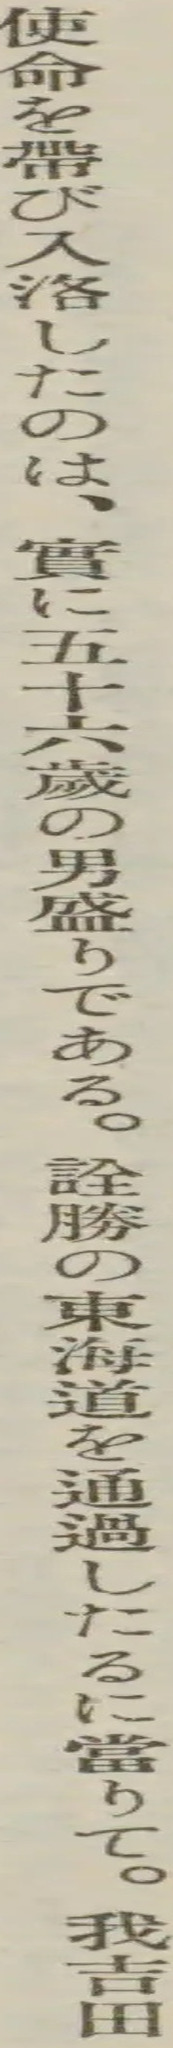使命を帯び入洛したのは、実に五十六歳の男盛りである。詮勝の東海道を通過したるに当りて。我吉田
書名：小野湖山翁小伝
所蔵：国立国会図書館 National Diet Library, JAPAN
